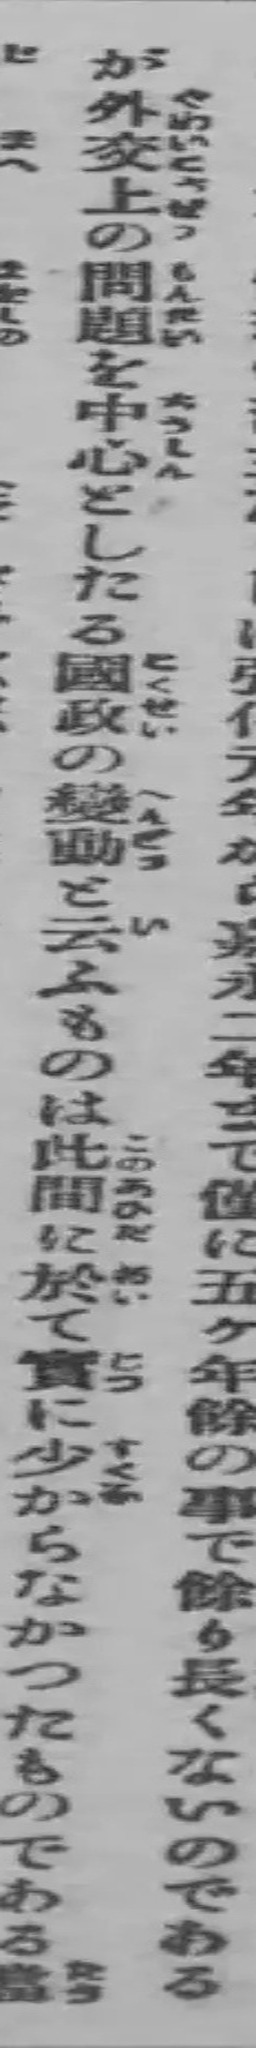が外交上の問題を中心としたる国政の変動と云ふものは此間に於て実に少からなかつたものである当
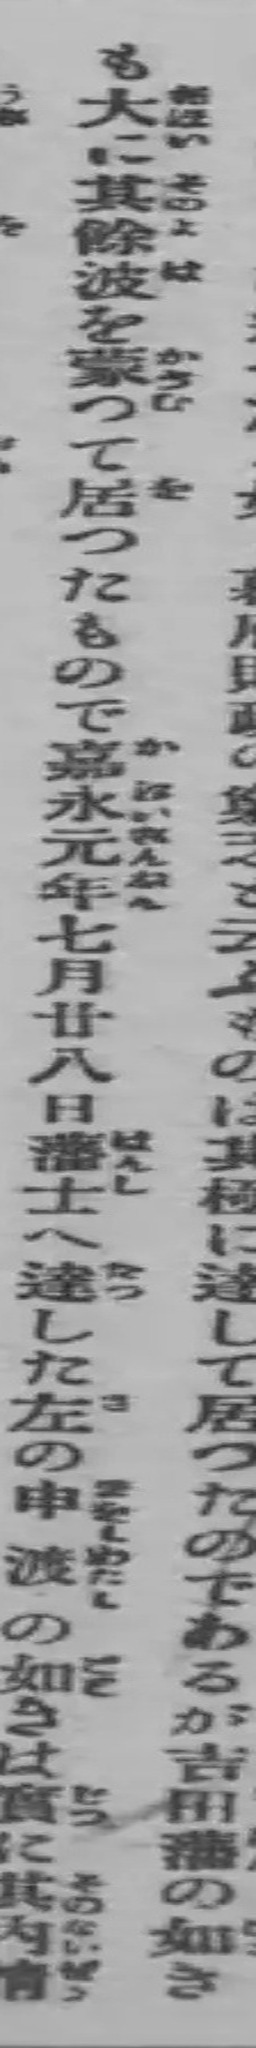も大に其余波を蒙つて居つたもので嘉永元年七月廿八日藩士へ達した左の申渡の如きは実に其内情
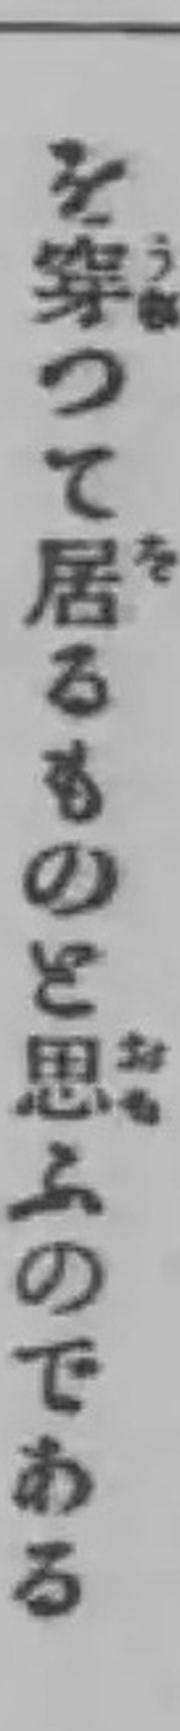を穿つて居るものと思ふのである
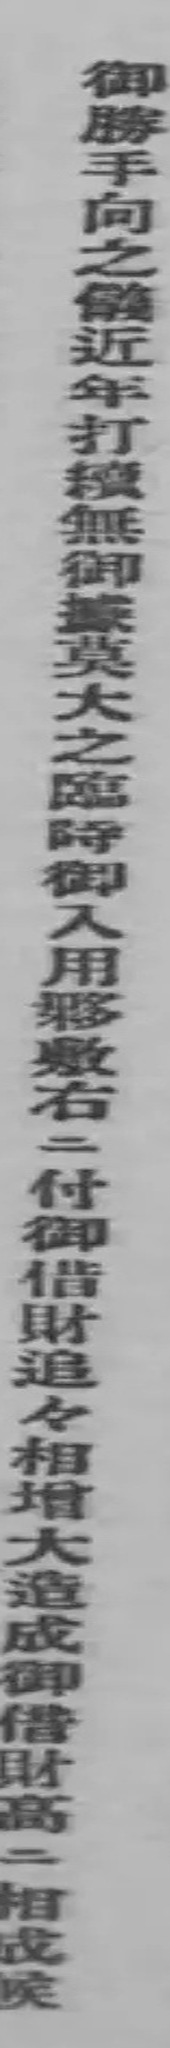御勝手向之儀近年打続無御拠莫大之臨時御入用夥敷右ニ付御借財追々相増大造成御借財高ニ相成候
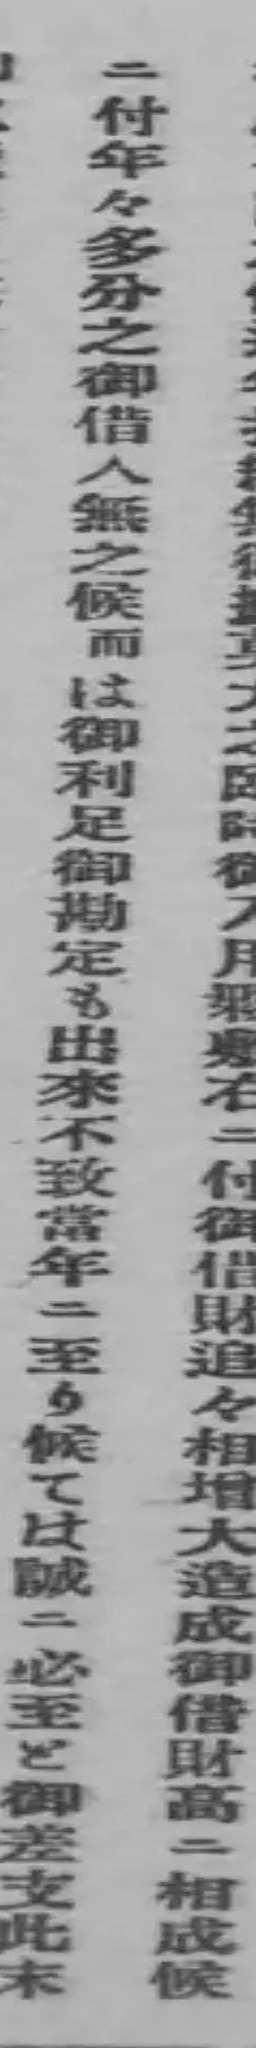ニ付年々多分之御借入無之候而は御利足御勘定も出来不致当年ニ至り候ては誠ニ必至と御差支此末
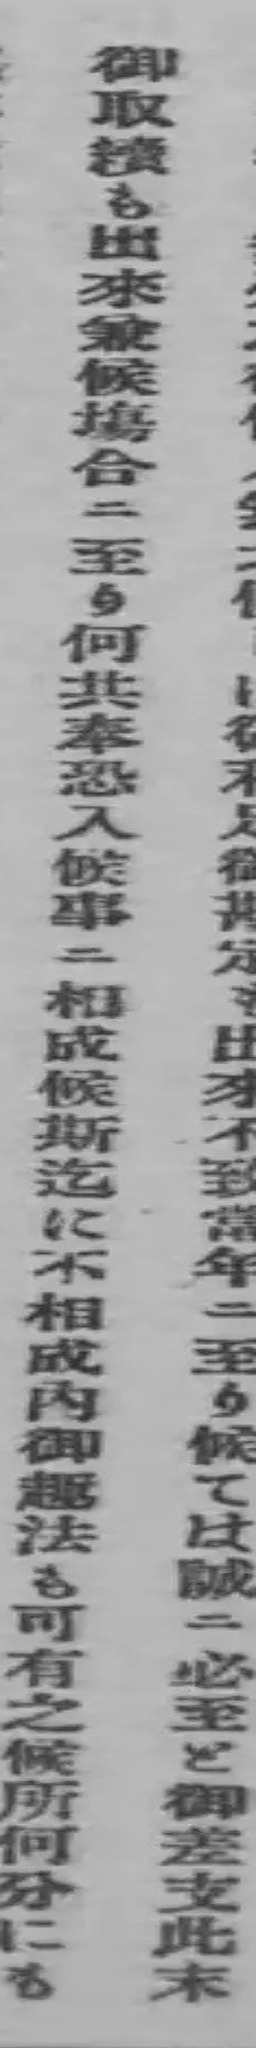御取続も出来兼候場合ニ至り何共奉恐入候事ニ相成候斯迄に不相成内御趣法も可有之候所何分にも
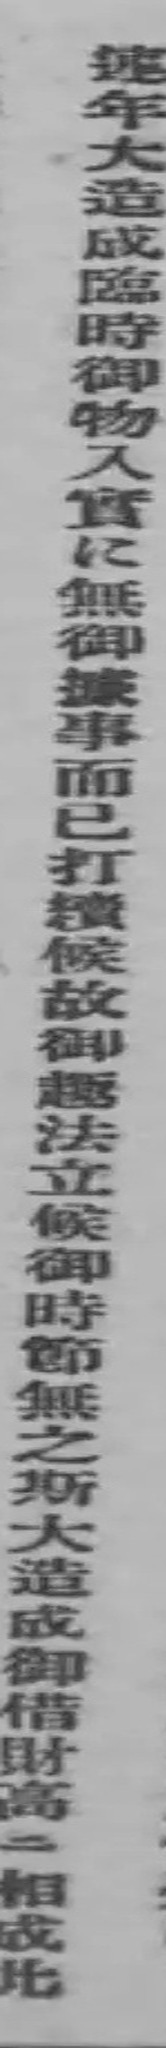連年大造成臨時御物入実に無御拠事而巳打続候故御趣法立候御時節無之斯大造成御借財高ニ相成此
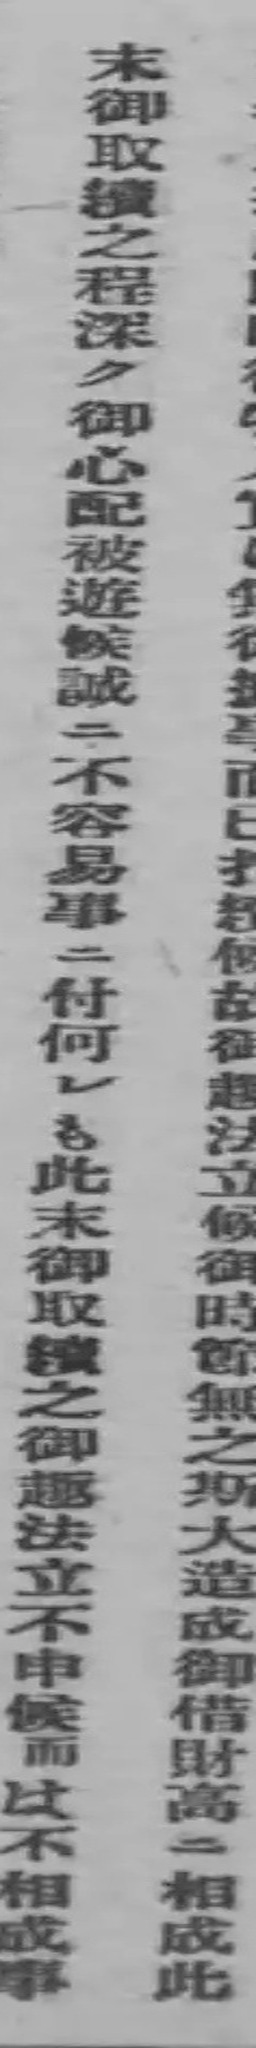未御取続之程深ク御心配被遊候誠ニ不容易事ニ付何レも此末御取続之御趣法立不申候而は不相成事
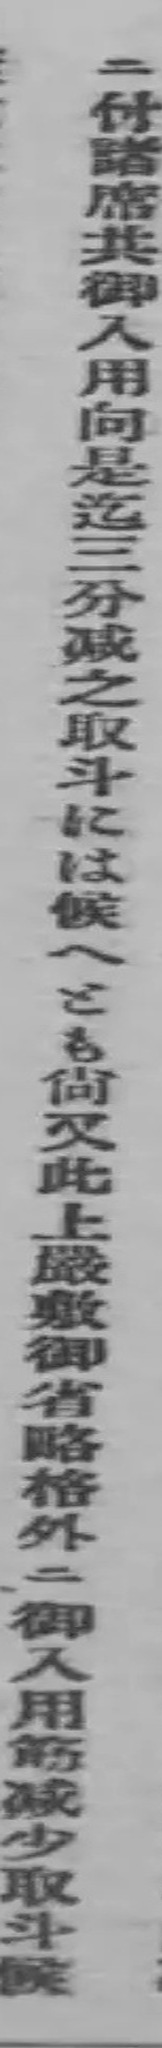ニ付諸席共御入用向是迄三分減之取斗には候へとも尚又此上厳敷御省略格外ニ御入用筋減少取斗候
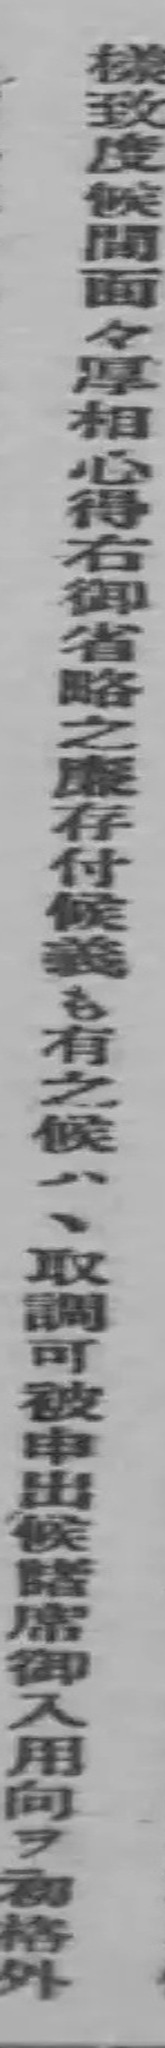様致度候間面々厚相心得右御省略之廉存付候義も有之候ハヽ取調可被申出候諸席御入用向ヲ初格外
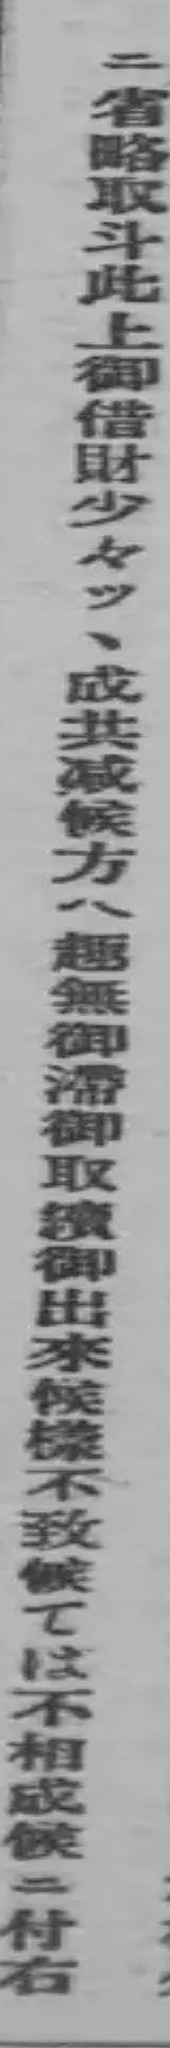ニ省略取斗此上御借財少々ツヽ成共減候方へ趣無御滞御取続御出来候様不致候ては不相成候ニ付右
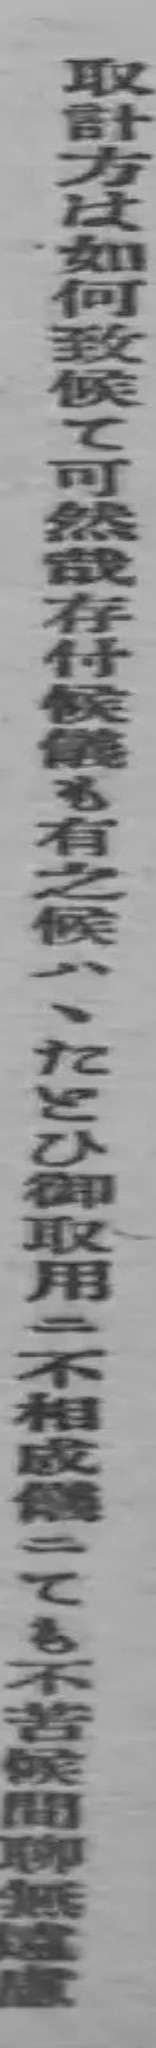取計方は如何致候て可然哉存付候儀も有之候ハヽたとひ御取用ニ不相成儀ニても不苦候間聊無遠慮
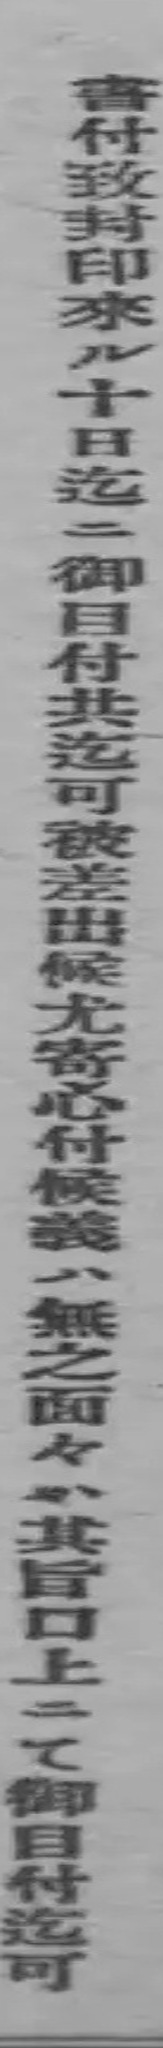書付致封印来ル十日迄ニ御目付共迄可被差出候尤寄心付候義ハ無之面々ハ其口上ニて御目付迄可
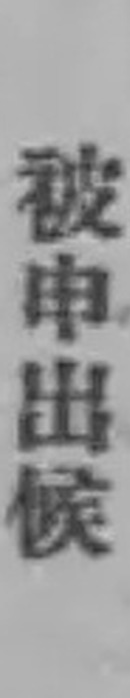被申出候
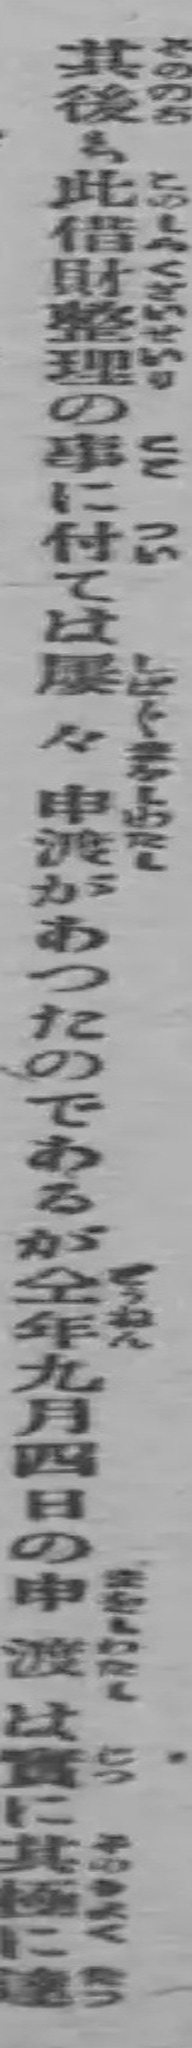其後も此借財整理の事に付ては屡々申渡があつたのであるが仝年九月四日の申渡は実に其極に達
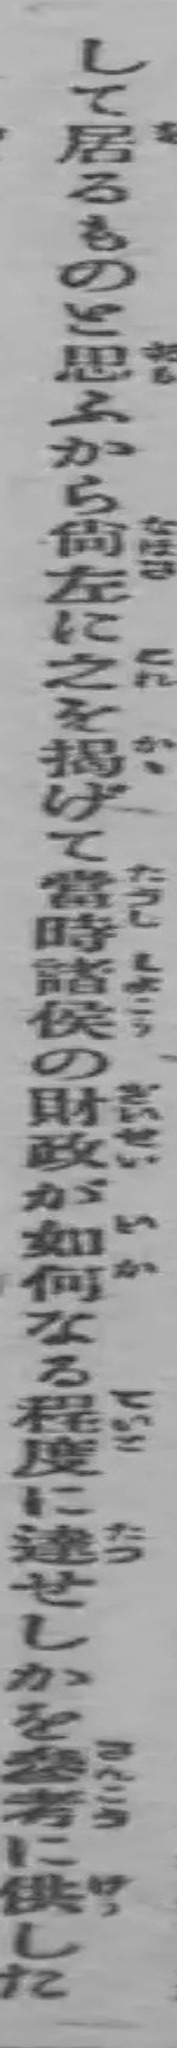して居るものと思ふから尚左に之を掲げて当時諸侯の財政が如何なる程度に達せしかを参考に供した
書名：豊橋市史談
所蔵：国立国会図書館 National Diet Library, JAPAN
